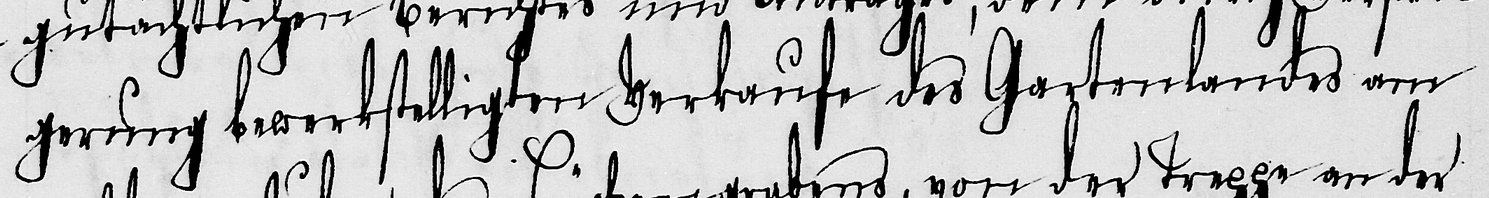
gerung bewerkstelligten Verkaufe des Gartenlandes am
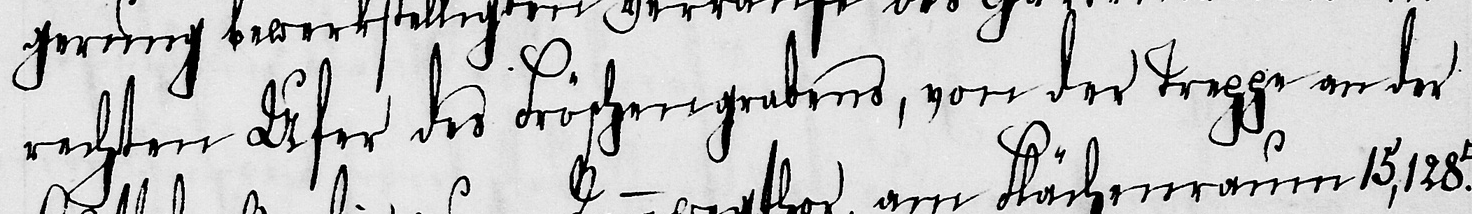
rechten Ufer des Fröschengrabens, von der Treppe an der
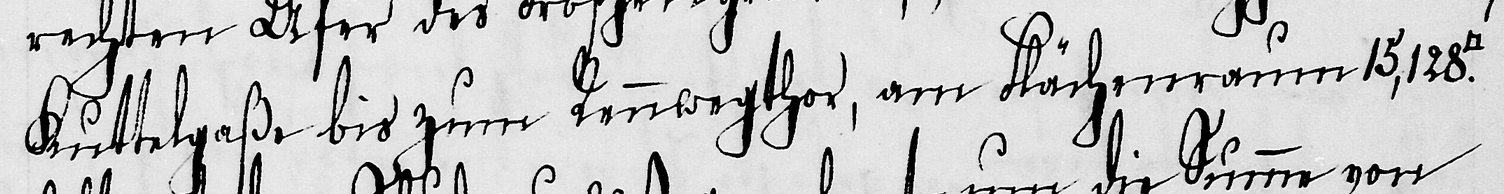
Kuttelgaße bis zum Rennwegthor, am Flächenraum 15,128.
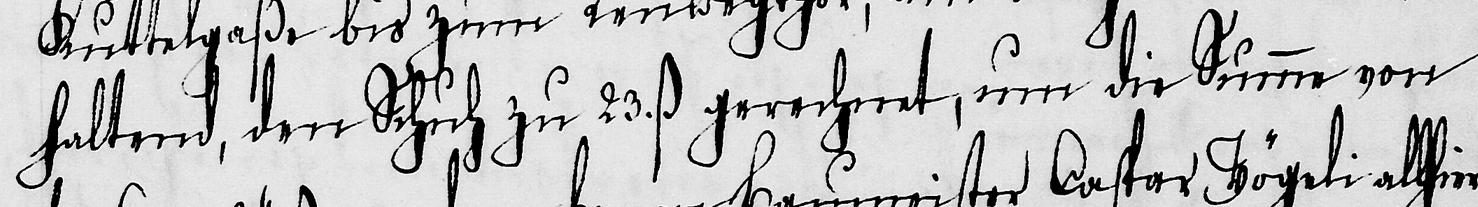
haltend, den Schuh zu 23. ß gerechnet, um die Summe von
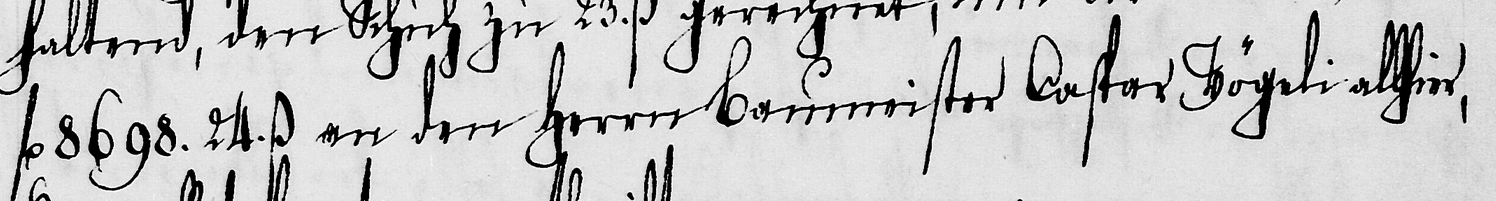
fl. 8698.24. ß an den Herrn Baumeister Caspar Vögeli allhier,
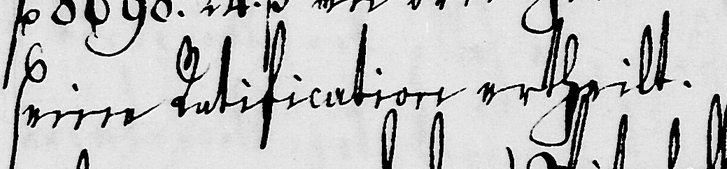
seine Ratification ertheilt.
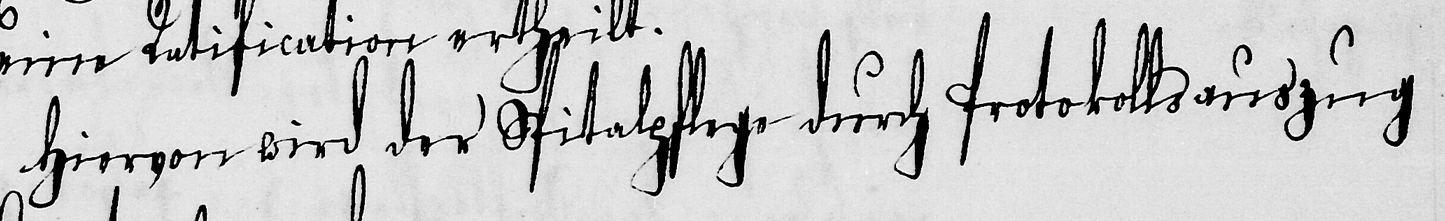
Hiervon wird der Spitalpflege durch Protokollsauszug
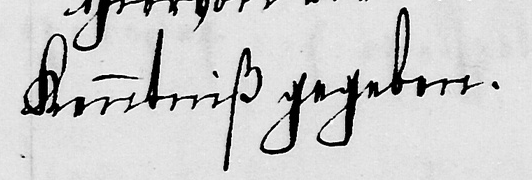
Kenntniß gegeben.
